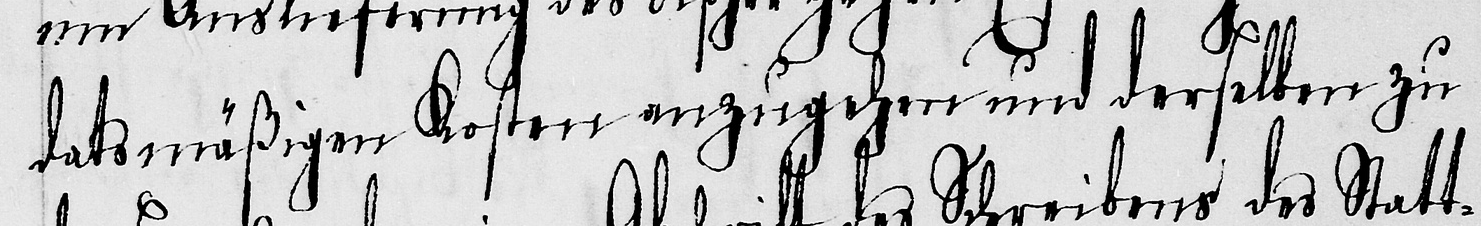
datsmäßigen Kosten anzugehen und derselben zu
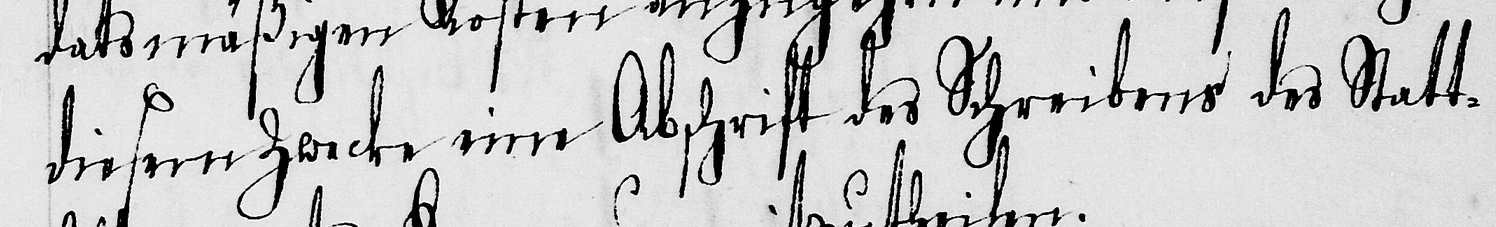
diesem Zwecke eine Abschrift des Schreibens des Statt¬
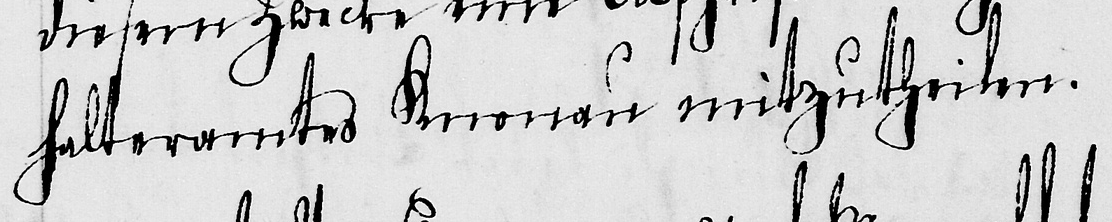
halteramtes Knonau mitzutheilen.
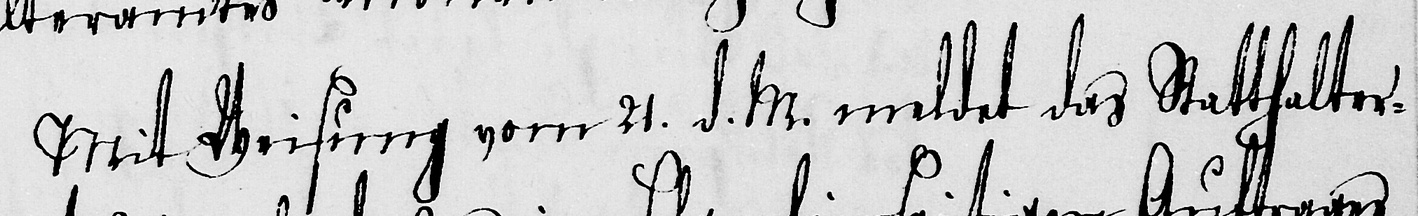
Mit Weisung vom 21. d. M. meldet das Statthalter¬
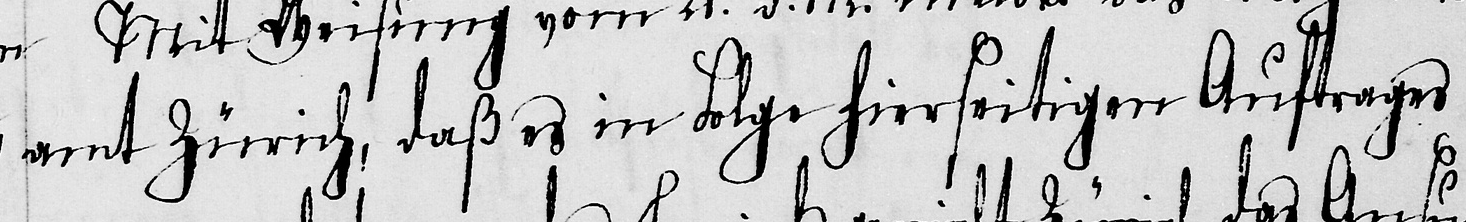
amt Zürich, daß es in Folge hierseitigen Auftrages
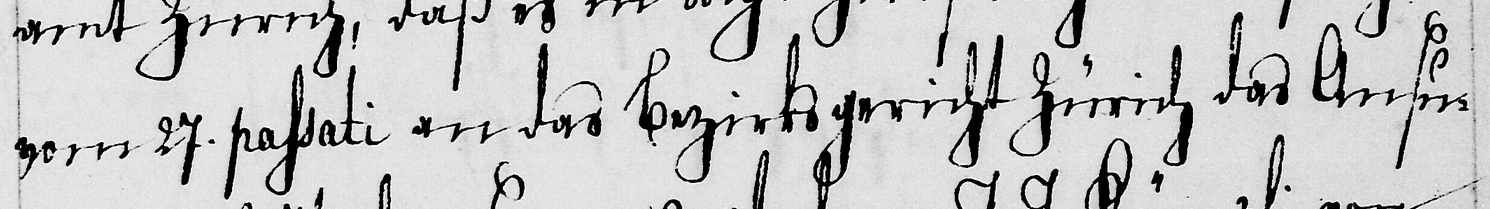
vom 27. passati an das Bezirksgericht Zürich das Ansu¬
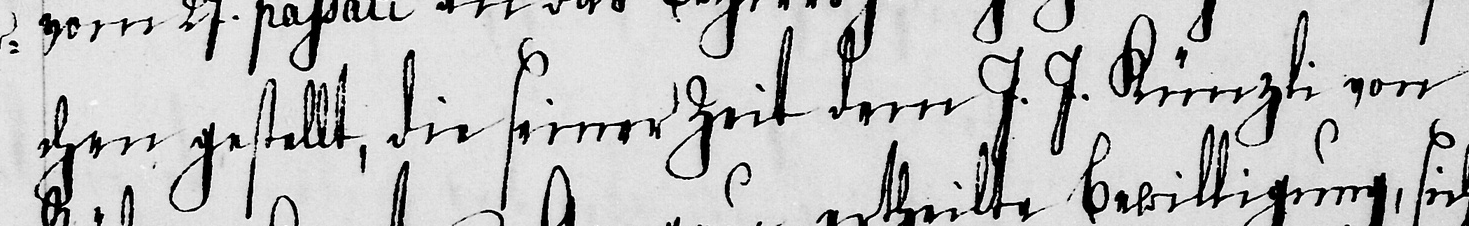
chen gestellt, die seiner Zeit dem J. J. Künzli von
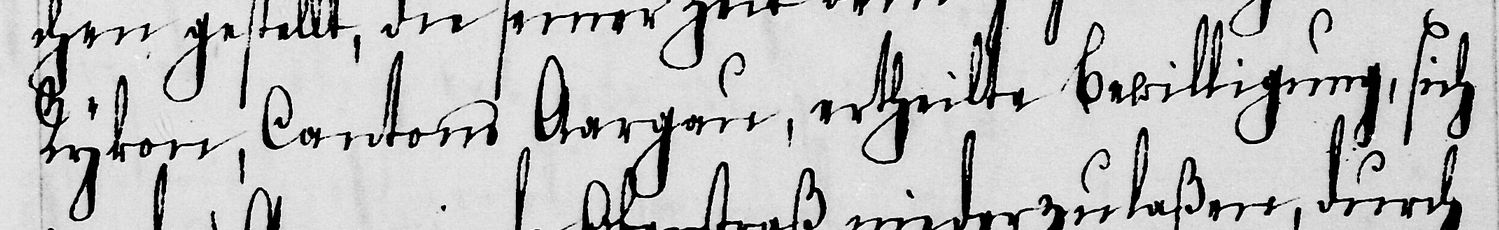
Rykon, Cantons Aargau, ertheilte Bewilligung, sich
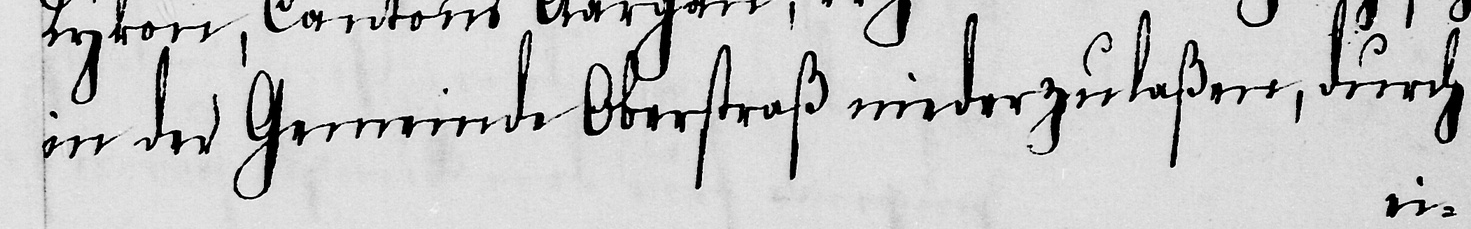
in der Gemeinde Oberstraß niederzulaßen, durch
